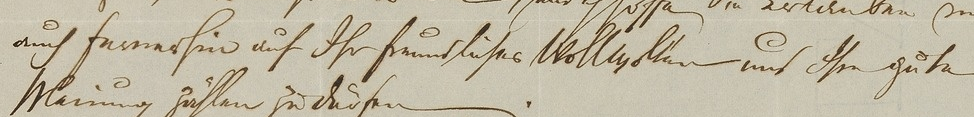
auch fernerhin auf Ihr freundliches Wohlwollen und Ihre gute
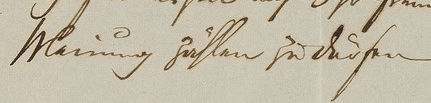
Meinung zählen zu dürfen.
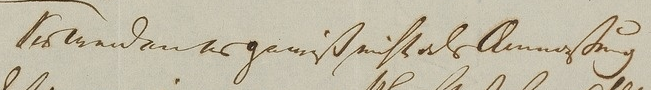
Sie werden es gewiß nicht als Anmaßung
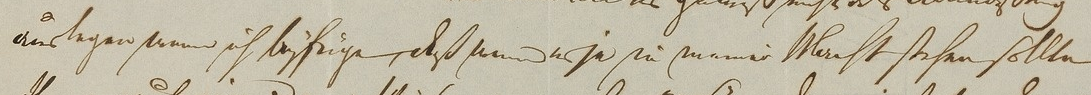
auslegen wenn ich beyfüge, daß wenn es je in meiner Macht stehen sollte
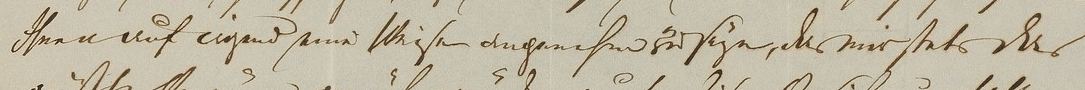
Ihnen auf irgend eine Weise angenehm zu seyn, das mir stets das
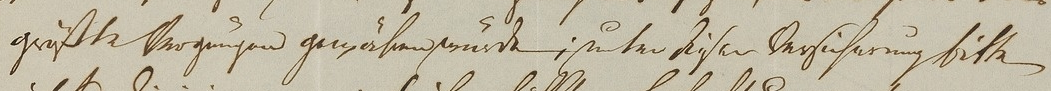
größte Vergnügen gewähren würde; unter dieser Versicherung bitte
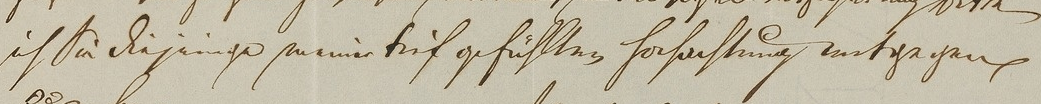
ich Sie diejenige meiner tief gefühlten Hochachtung entgegen
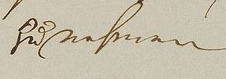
zu nehmen
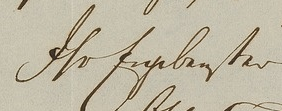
Ihr Ergebenster
